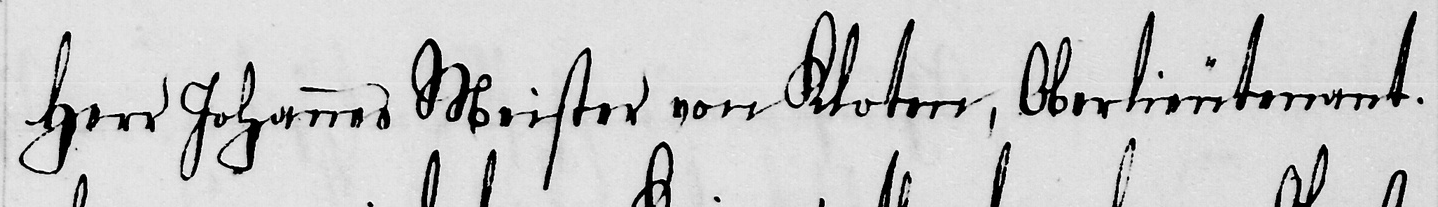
Herr Johannes Meister von Kloten, Oberlieutenant.
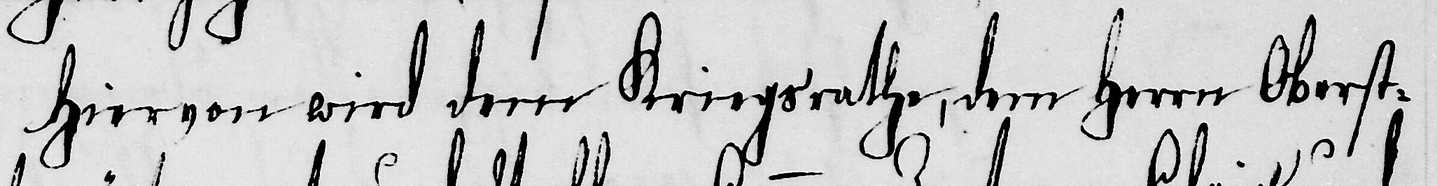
Hiervon wird dem Kriegsrathe, dem Herrn Oberst¬
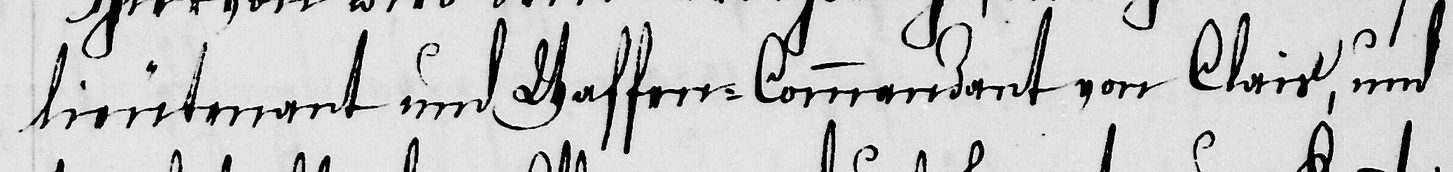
lieutenant und Waffen-Commandant von Clais, und
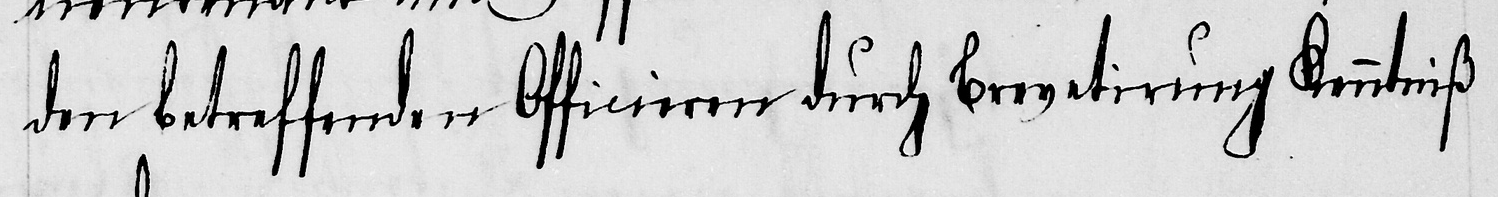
den betreffenden Officieren durch Brevetirung Kenntniß
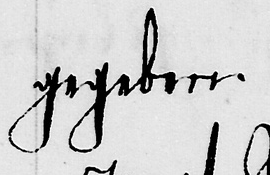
gegeben.
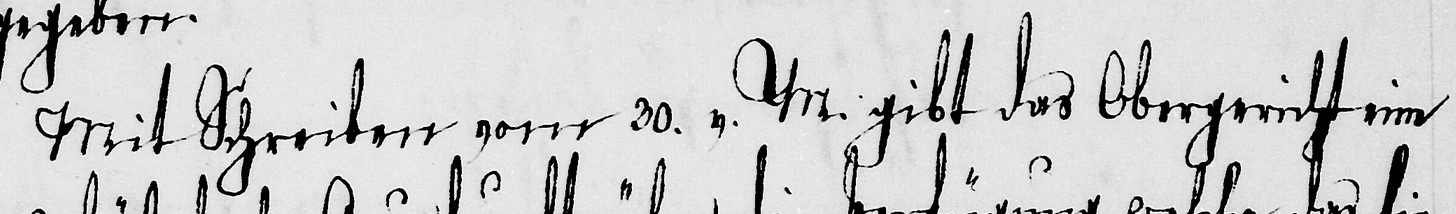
Mit Schreiben vom 30. v. M. gibt das Obergericht eine
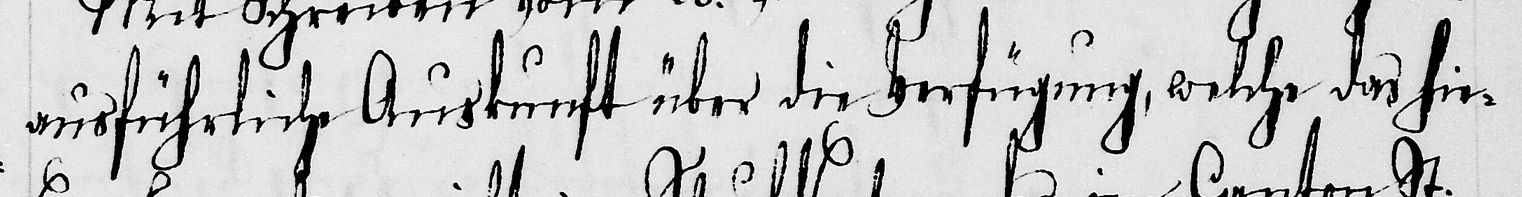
ausführliche Auskunft über die Verfügung, welche das hie¬
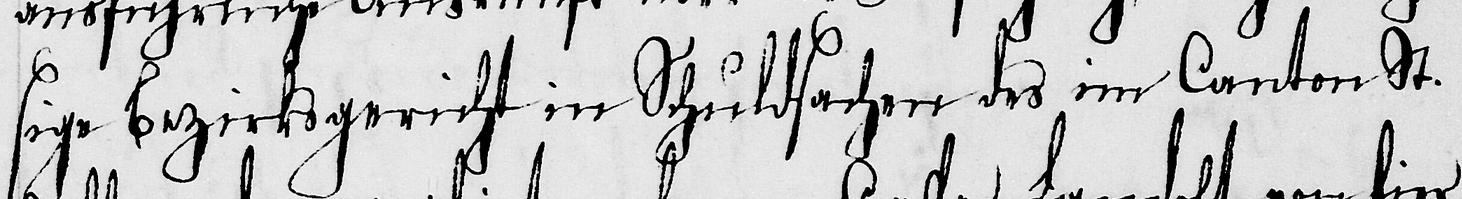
sige Bezirksgericht in Schuldsachen des im Canton St.
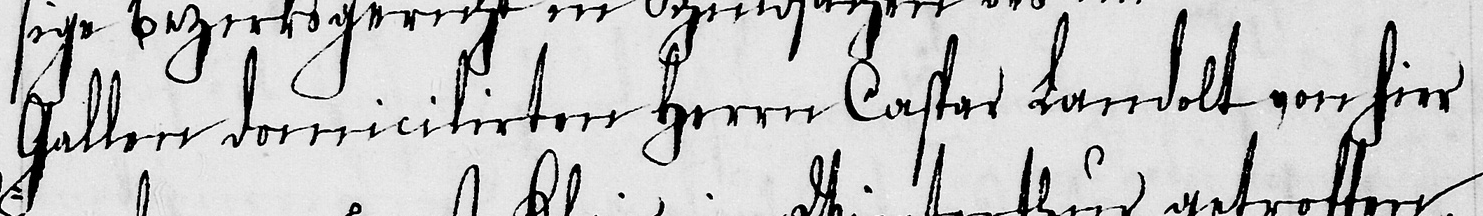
Gallen domicilirten Herrn Caspar Landolt von hier
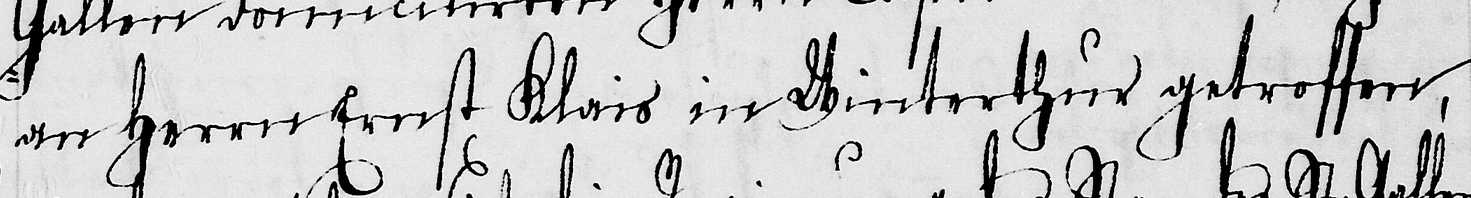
an Herrn Ernst Klais in Winterthur getroffen,
